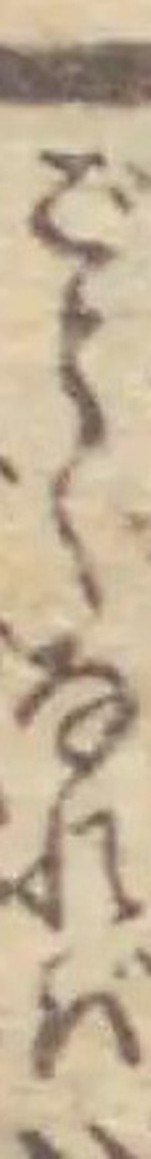ごとくなれば
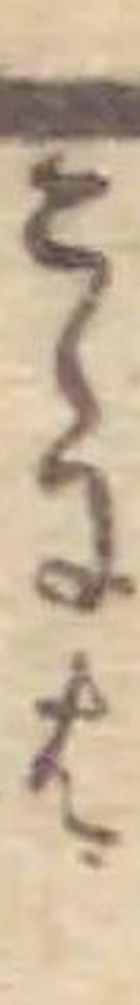こゝには
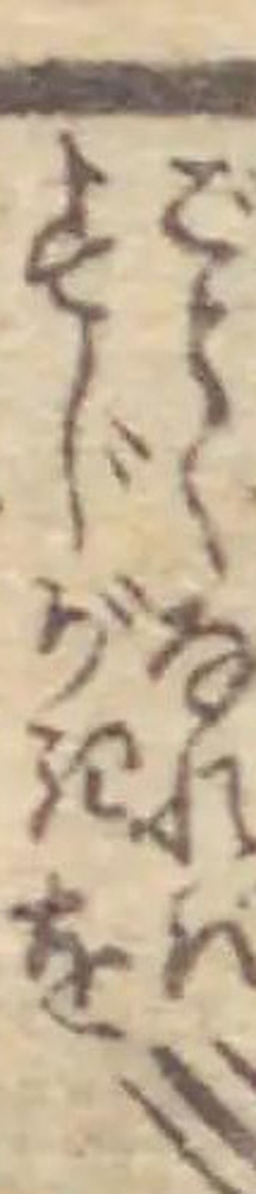すじがきを
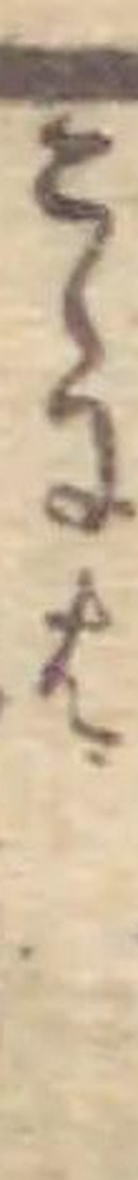こゝには
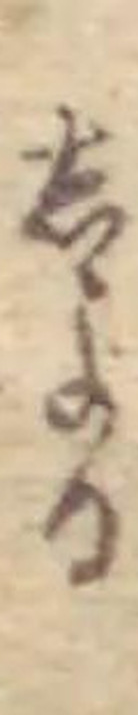しよる

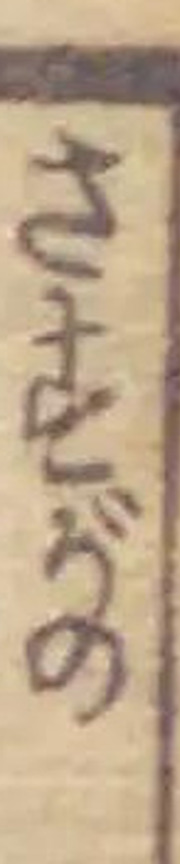さすがの
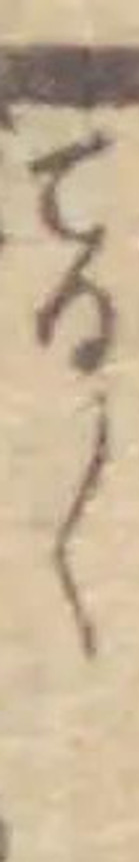てる〳〵
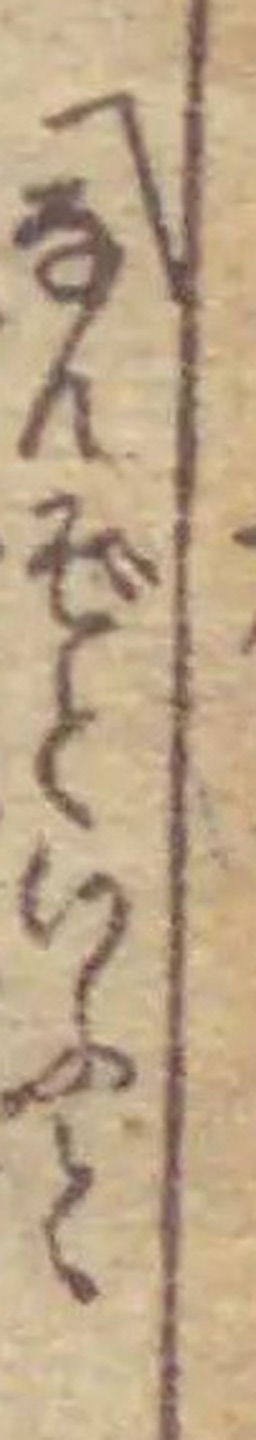〽なんぞといふと
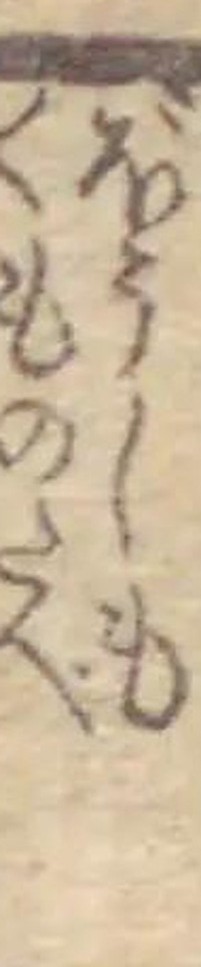くものたへ
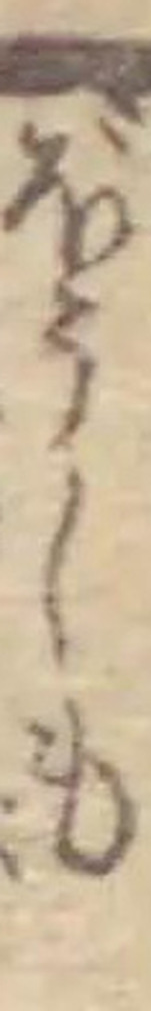ぼうしも
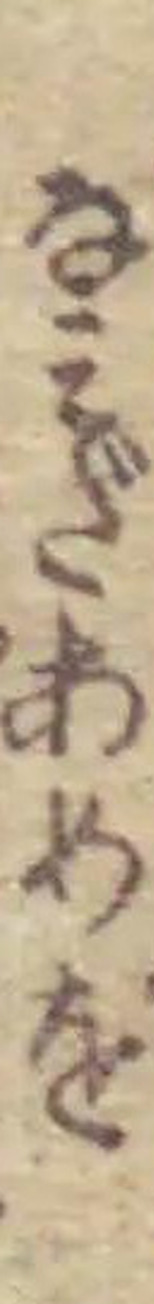なみだあめを
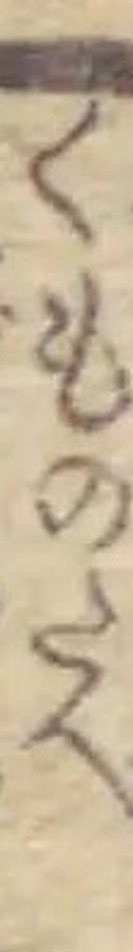くものたへ
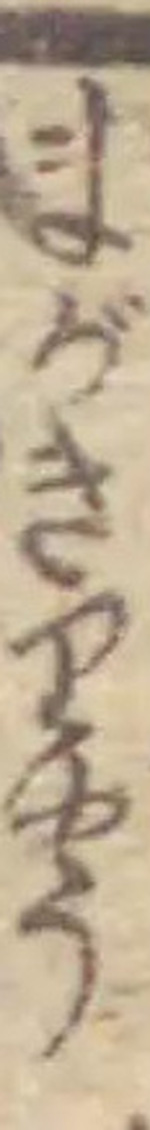まがきりやう
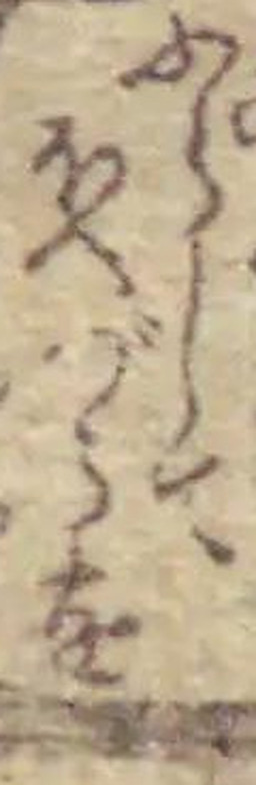ほへづらを
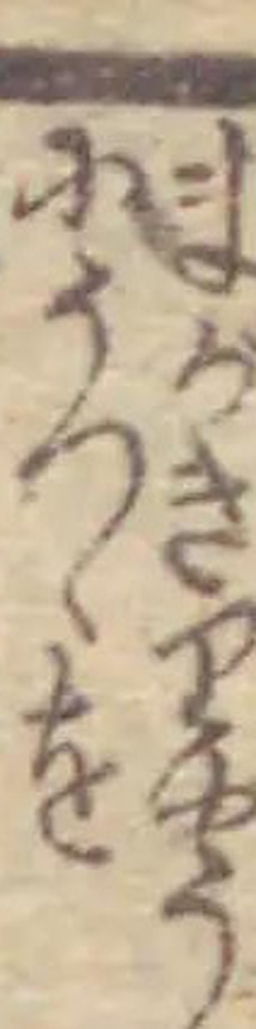にうつゝを
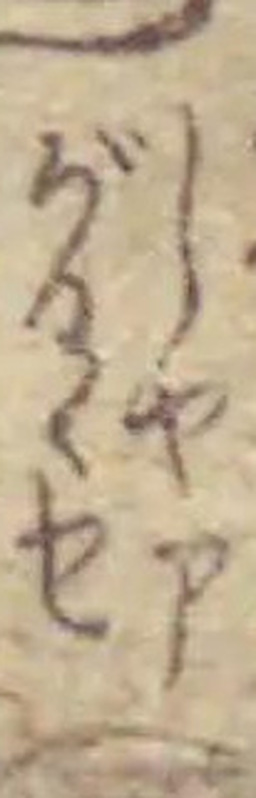がるくせ
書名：雨宮風宮出儘略縁記 3巻
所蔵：国立国会図書館 National Diet Library, JAPAN
